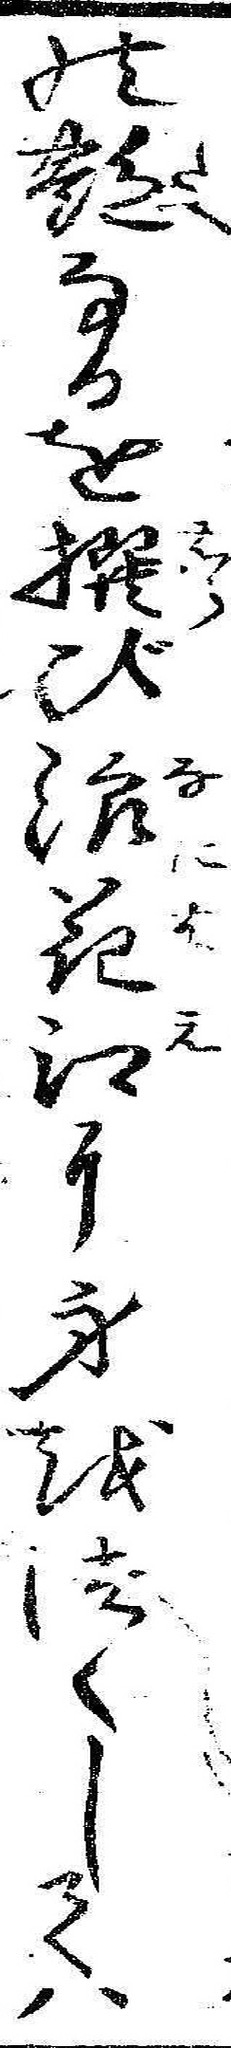の艶なるを撰び浪花江に身をつくしては
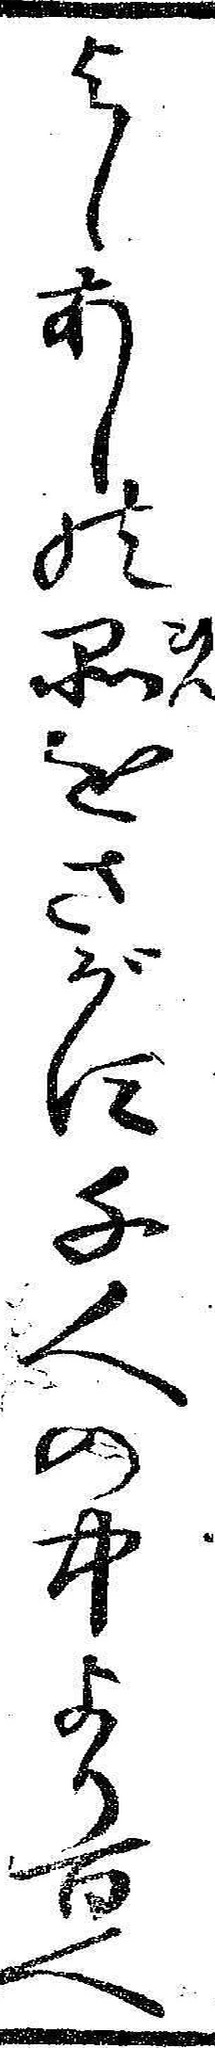よしあしの品をさがす千人の中より百人
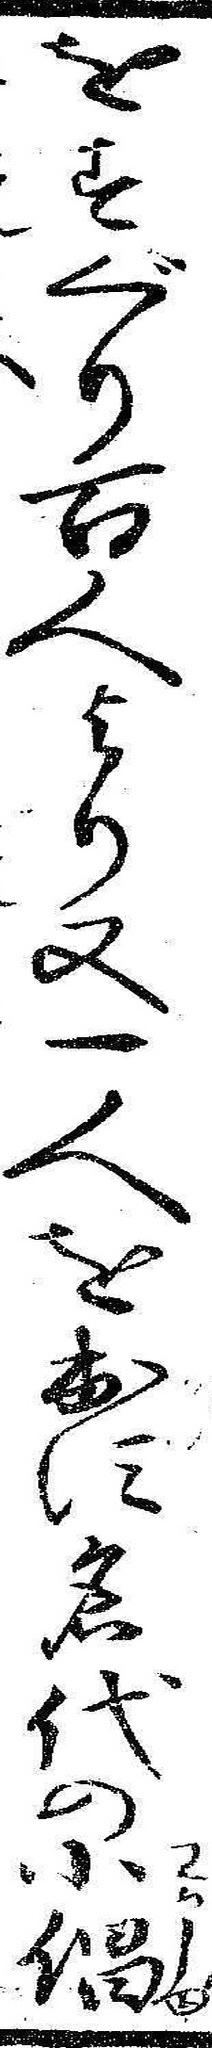をすぐり百人より又一人を出す名代の小偶
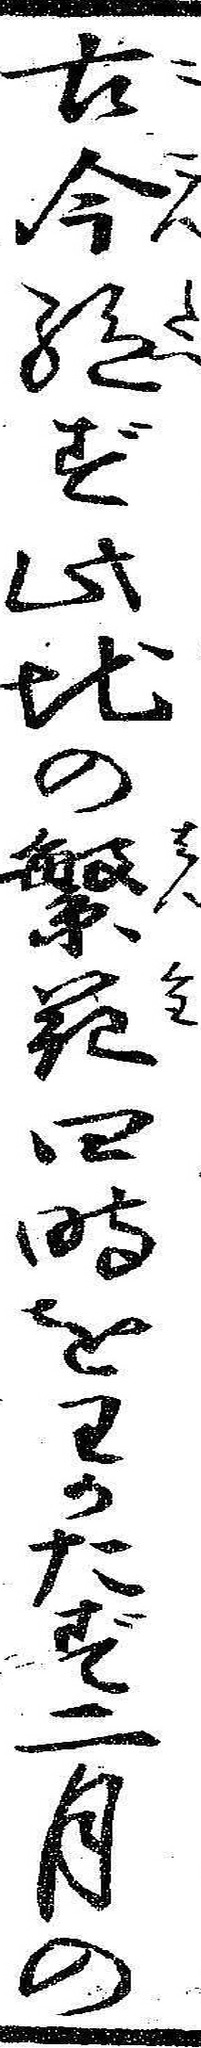古今絶ず此地の繁花四時をわかたず二月の
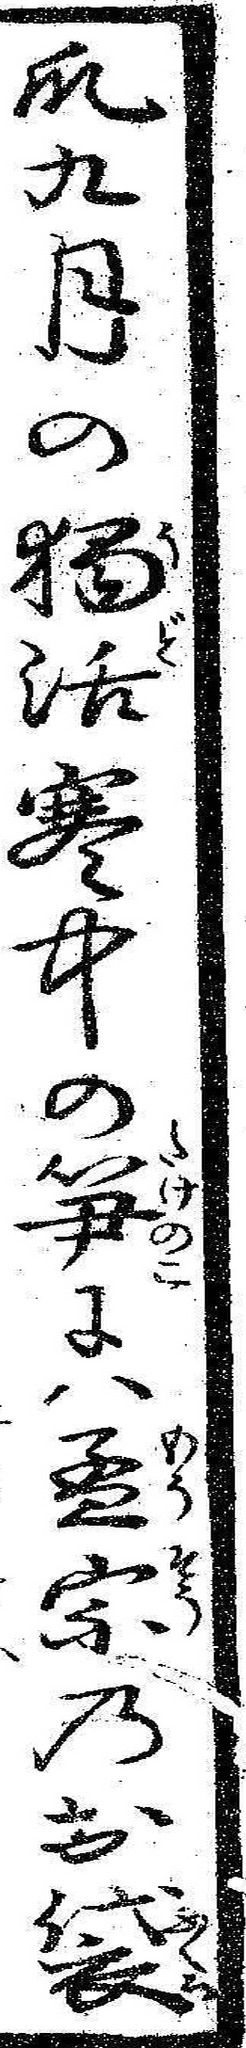瓜九月の独活寒中の筍には孟宗のお袋
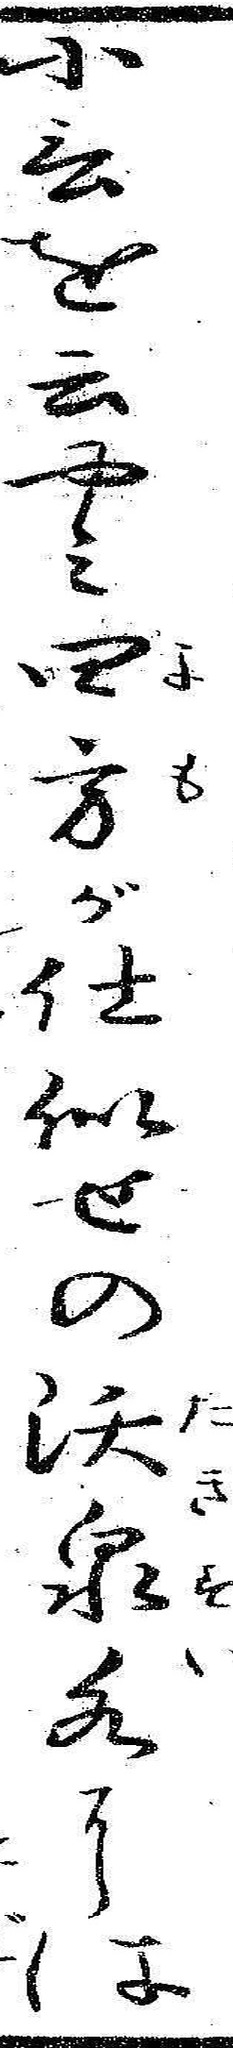小言を云やみ四方が仕似せの沃泉水には
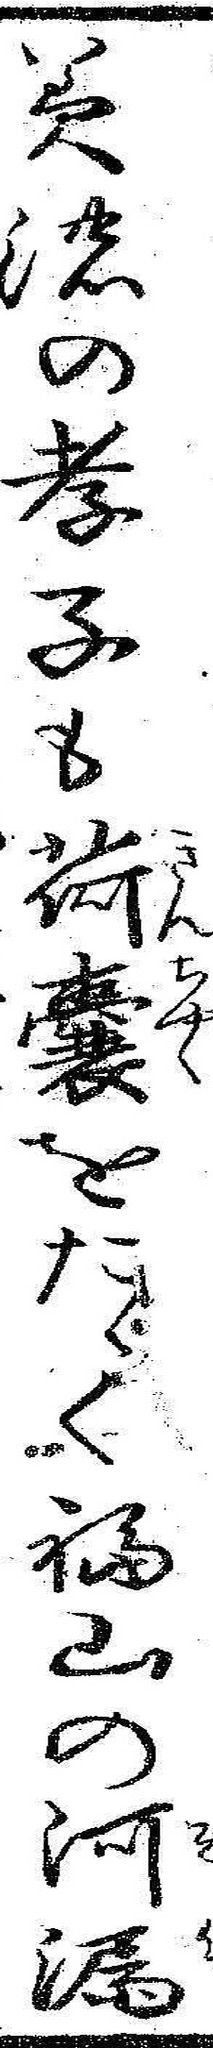美濃の孝子も荷嚢をたゝく福山の河漏
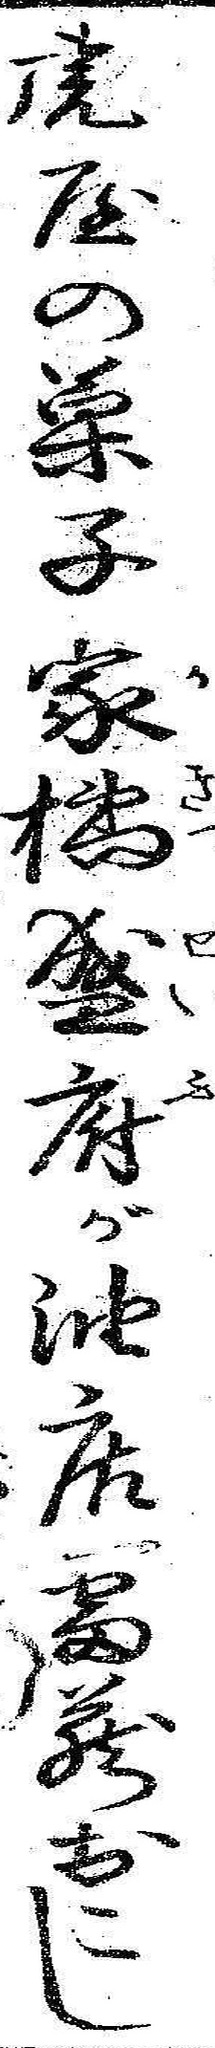虎屋の菓子家橘盛府が油店雷蔵おこし
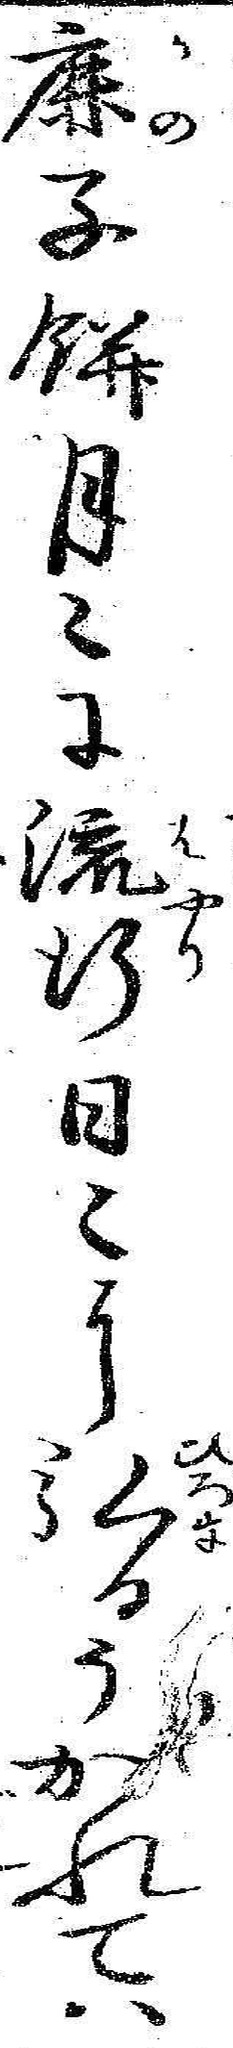鹿子餅月々に流行日々に弘るうかれては
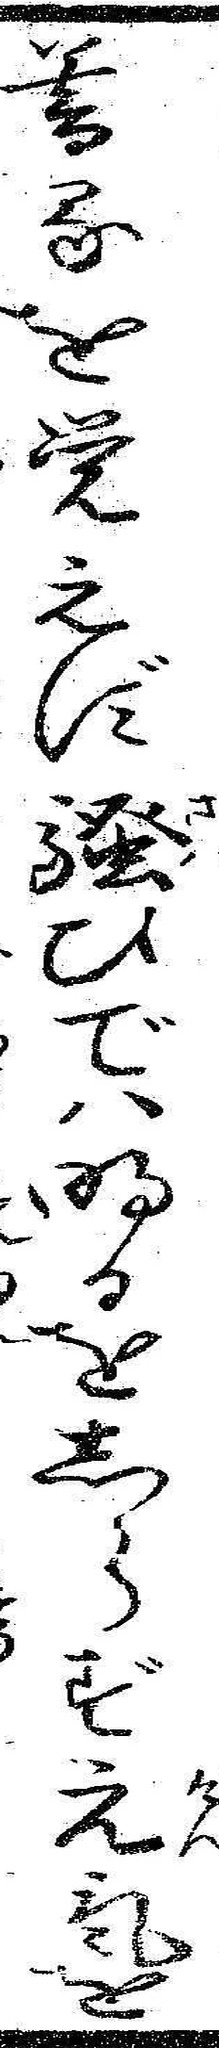暮るを覚えず騒ひでは明るをしらず元気を
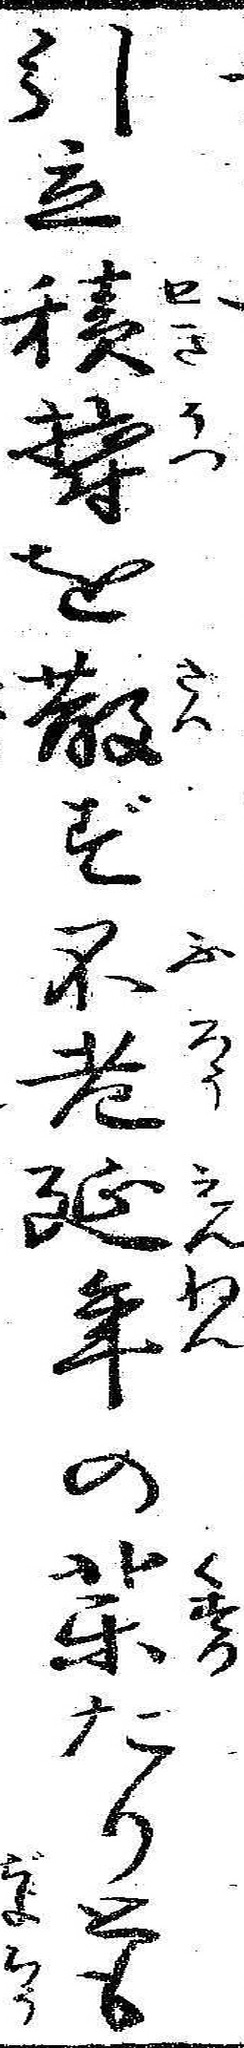引立積欝を散ず不老延年の薬たりとも
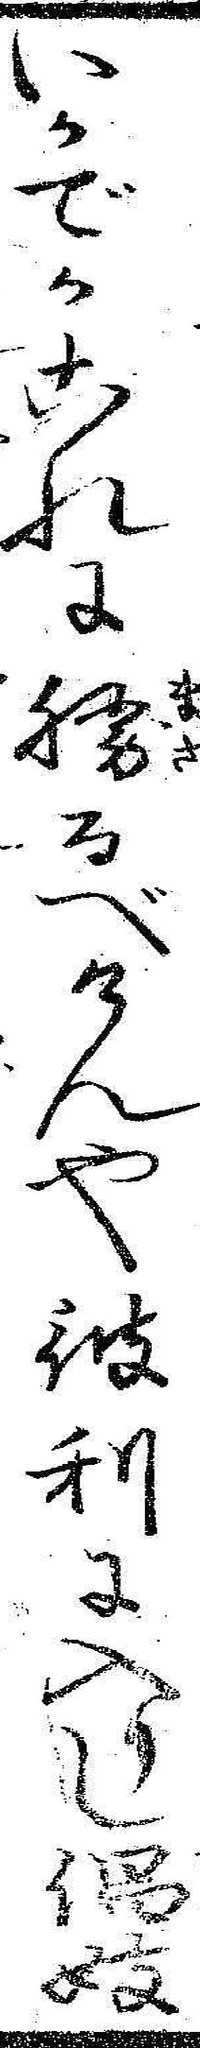いかでかこれに勝るべけんや彼利に入りし倡妓
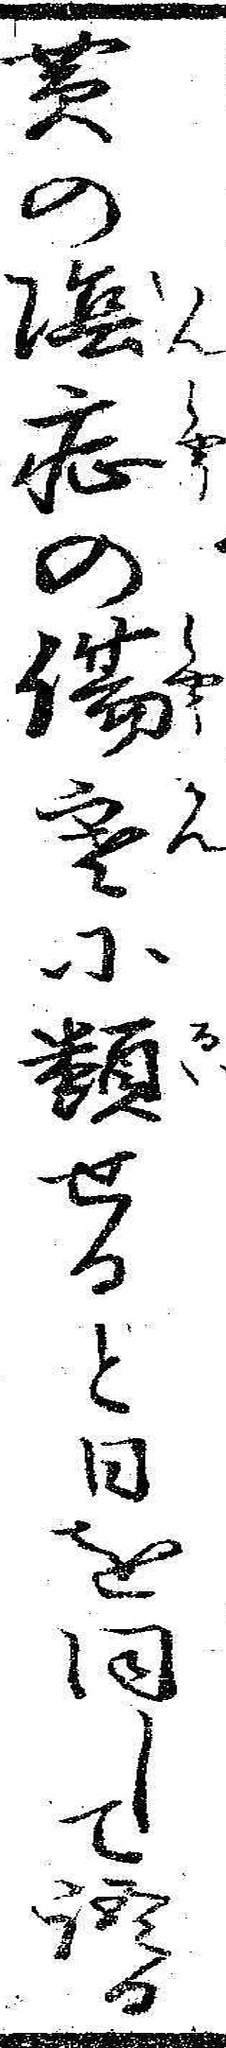買の陰症の傷寒に類せると日を同して語る
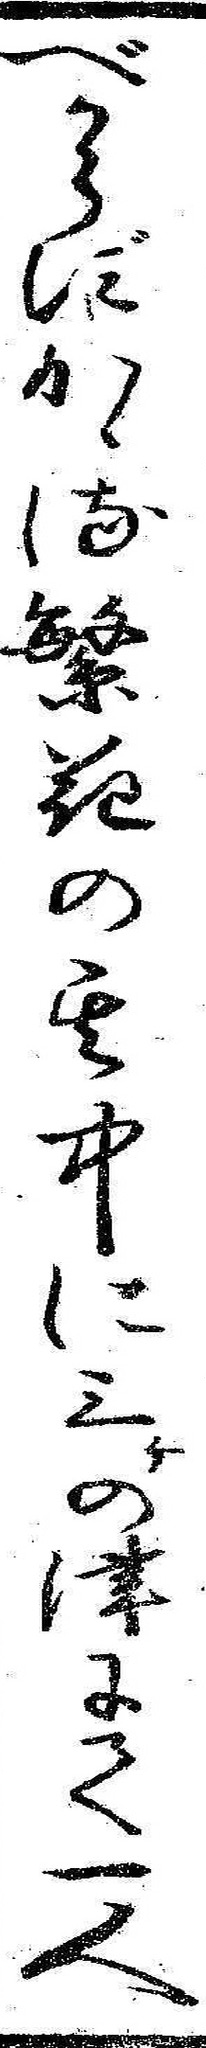べからずかゝる繁花の其中に三ヶの津にて一人

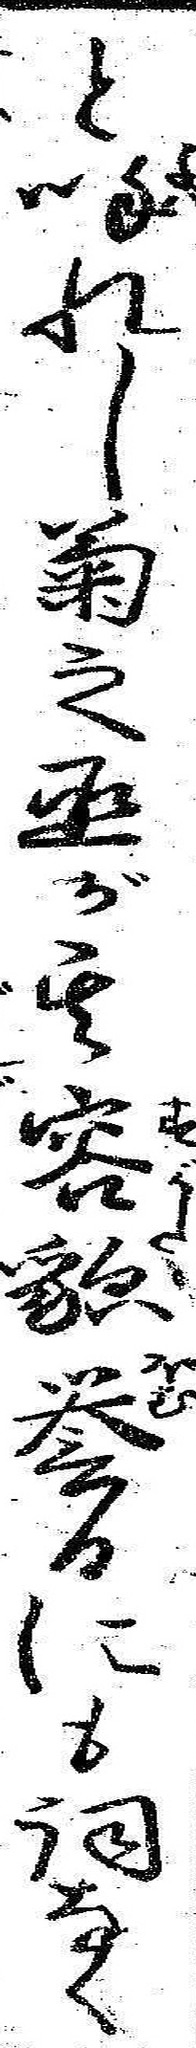と呼れし菊之丞が其容貌誉るにも詞なく
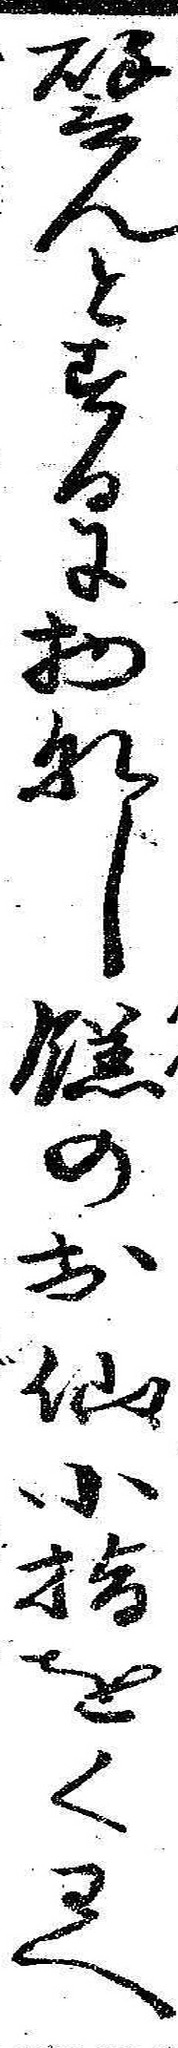譬んとするに物なし䭐のお仙小指をくわへ
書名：根無草後編
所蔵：国文学研究資料館
